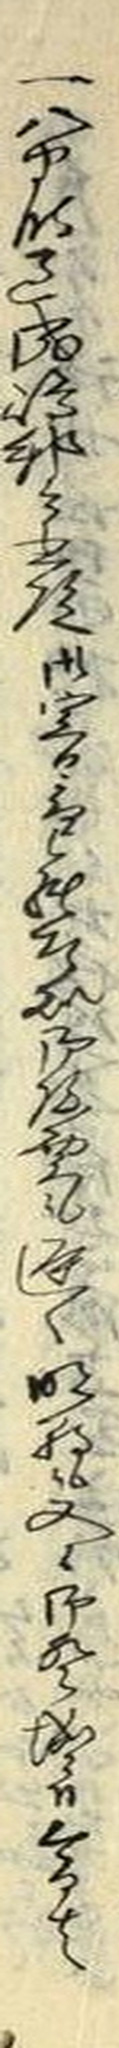一八半時過成嶋邦之丞殿御定日ニ而被罷出候処御帰殿も遅く明朝も又々御登城ニ付今日者
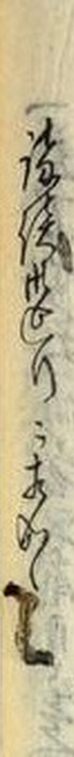講談御延引ニ相成候
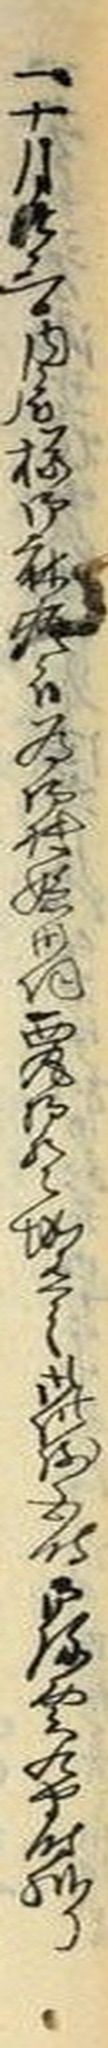一十月廿三日内府様御麻疹ニ付為御機嫌御伺西丸御登城有之御供揃五時御帰殿九半時掛り
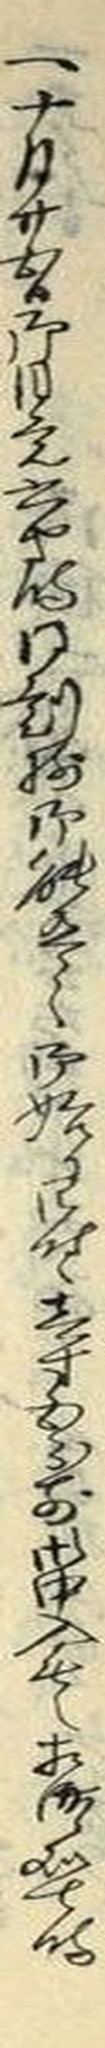一十月廿五日御目覚六半時同刻揃御能有之御始り四時へ壱寸五分前御中入無之相済候処七時
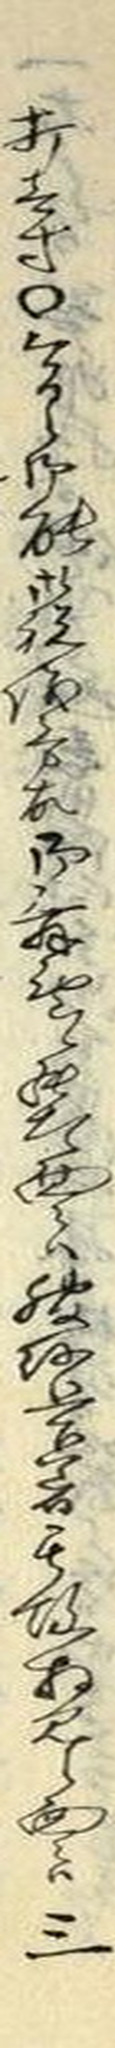打壱寸〇今日之御能御祝儀方故御舞台へ罷出候面々ハ服沙上下着其余拝見之面々ハ三
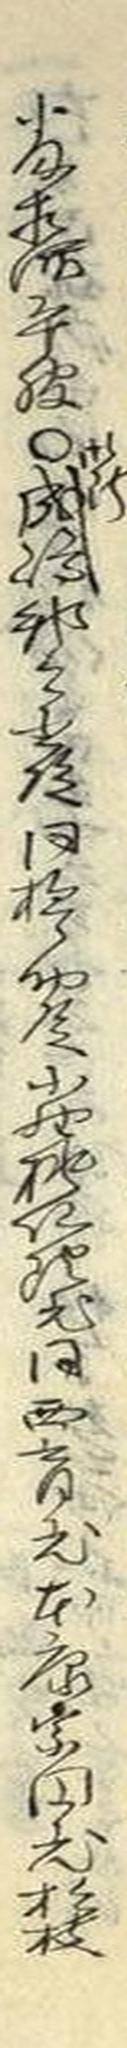番相済平服〇成嶋邦之丞殿同桓之助殿小野桃仙院老同西育老本康宗円老杉枝
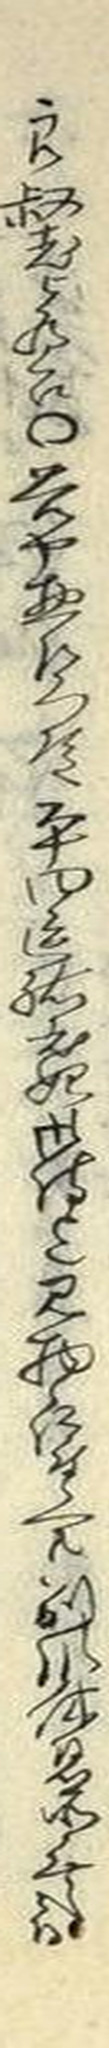良叔老被為召〇谷中惣左衛門殿平田道祐老始御侍迄見物被仰付候へ共別段休息所無之ニ付
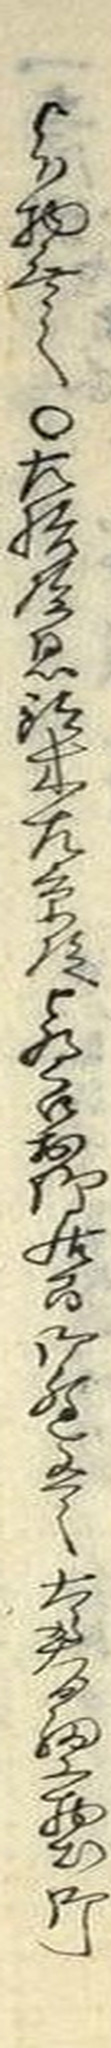被下物無之〇左膳殿息鈴木左京殿被為召於御居間御逢有之大奥ゟ細工物出御
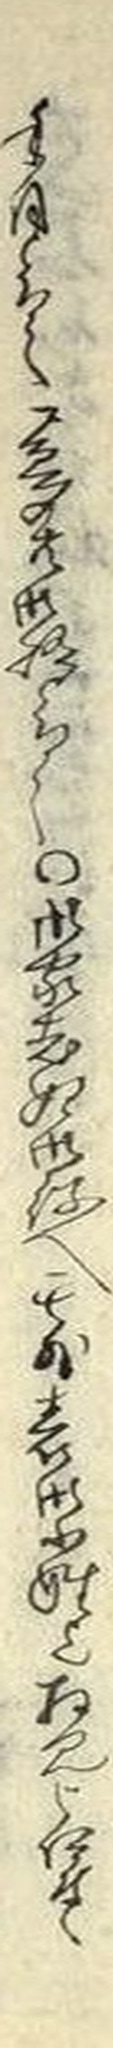手自被下之昼夕共御賄被下之〇御家老始御役人其外表御小姓迄拝見被仰付候
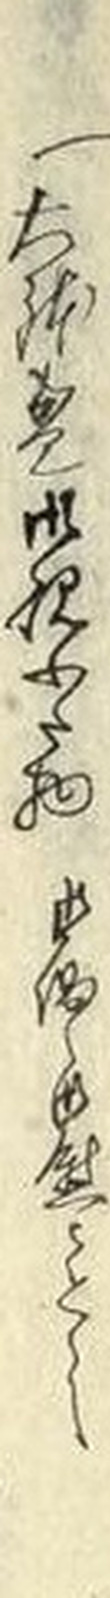大鉢盛御硯ふた物御側御慰被進之
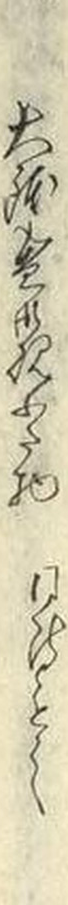大鉢盛御硯ふた物御側御慰被進之
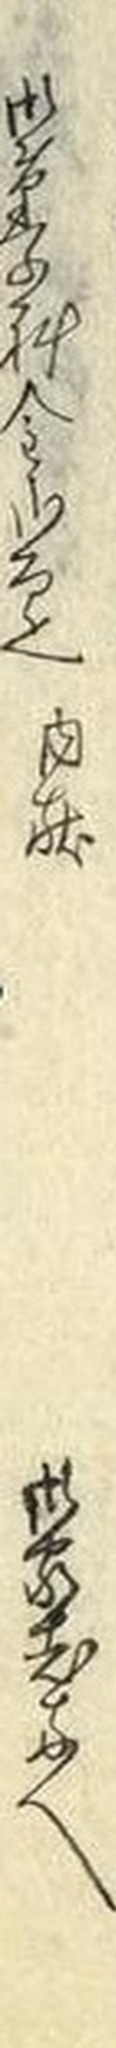御菓子料金弐百疋内献御家老両人
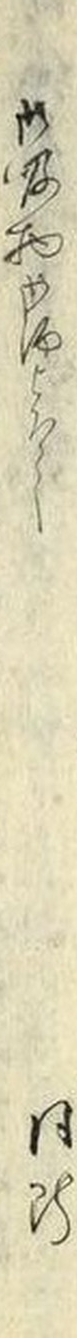御吸物御酒被下之同断
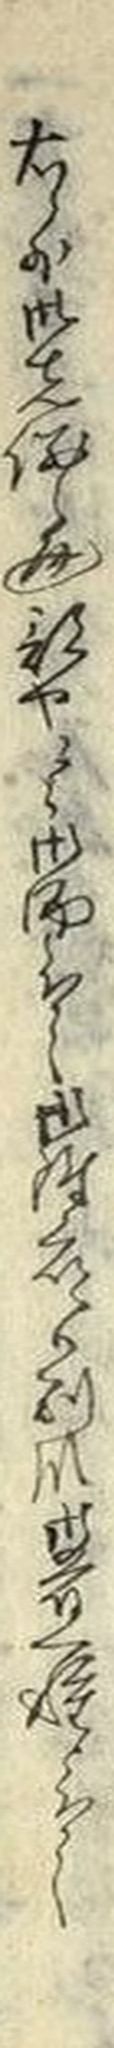右之外御先例之通部屋々々御酒被下御附衆へハ別段御肴一種被下之
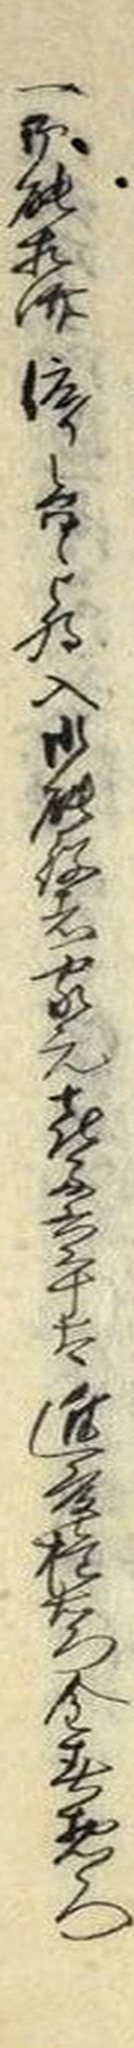一御能相済渡り之間へ被為入御能役者家元喜多六平太進藤権右衛門金春惣右衛門

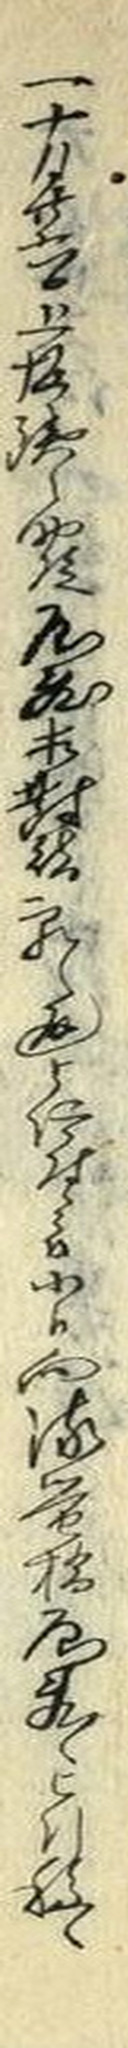一十月廿六日上坂鉄之助殿屋敷相対替願之通被仰付候ニ付小日向流蛍橋屋敷へ被引移候
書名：少傅日録抄（斉善付側向頭取日記、在府）
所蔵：福井県文書館 Fukui Prefectural Archives
